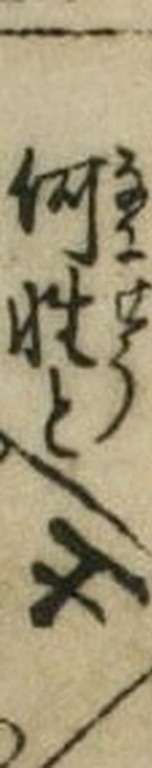何性と
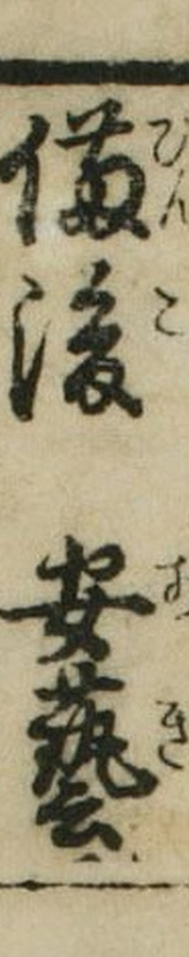備後安芸
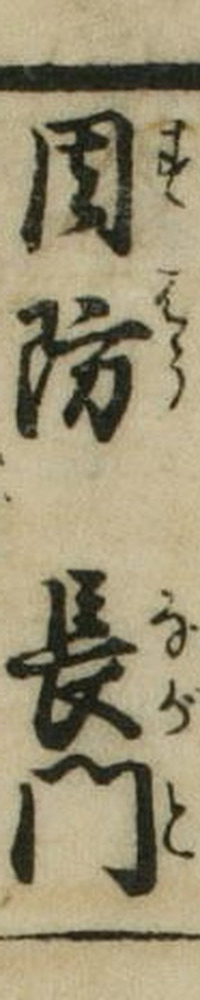周防長門
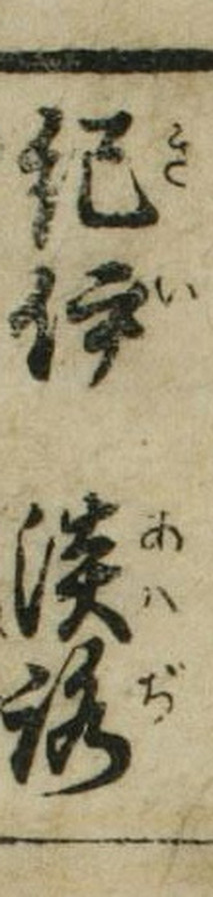紀伊淡路
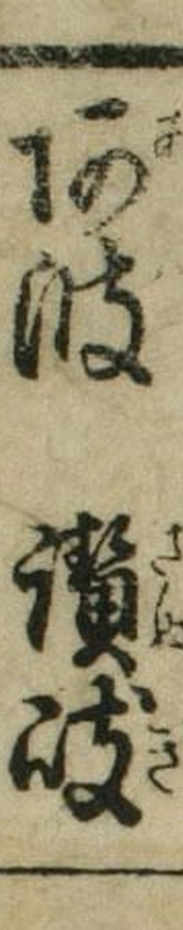阿波讃岐
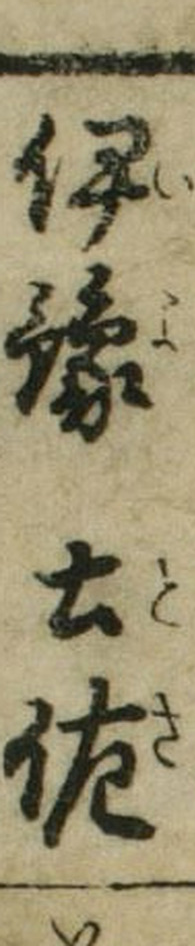伊予土佐
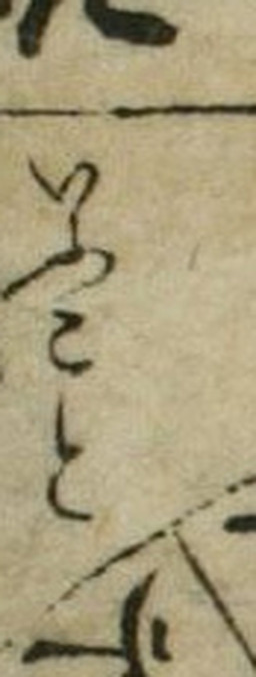いふこと
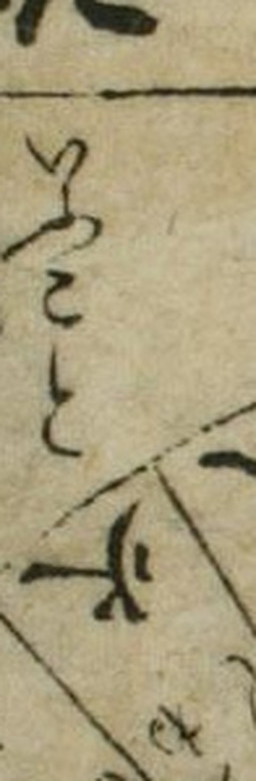いふこと
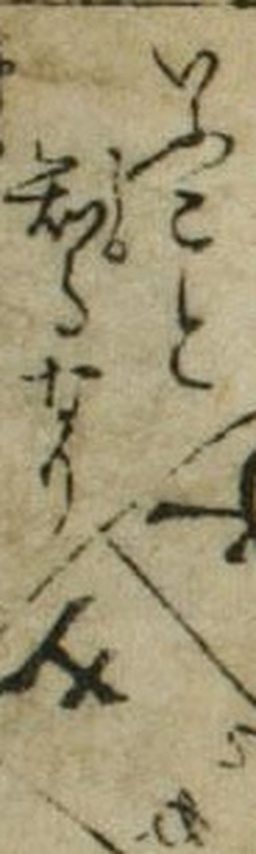知るなり
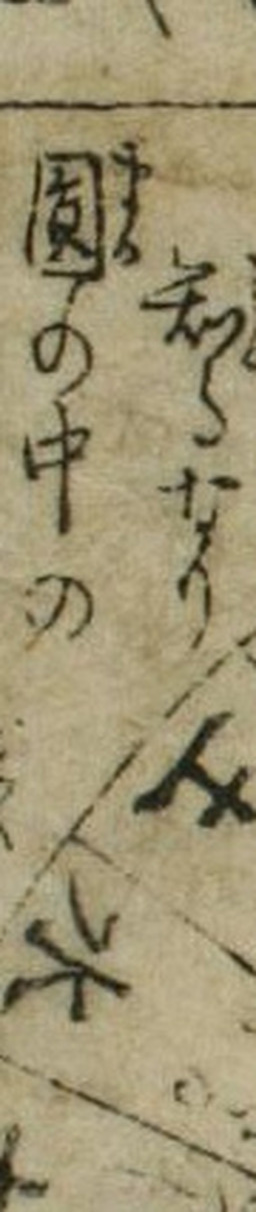円の中の
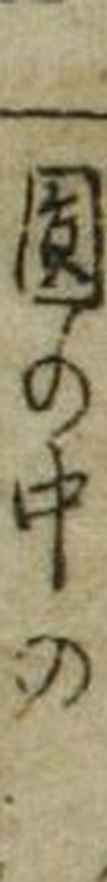円の中の
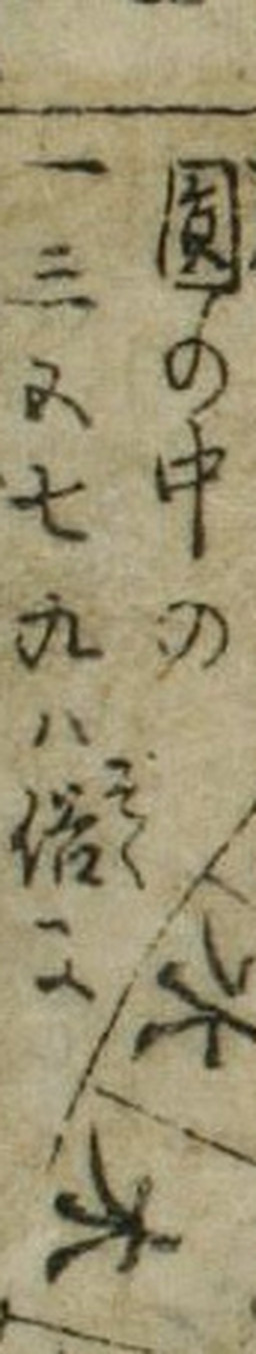一三五七九は俗に
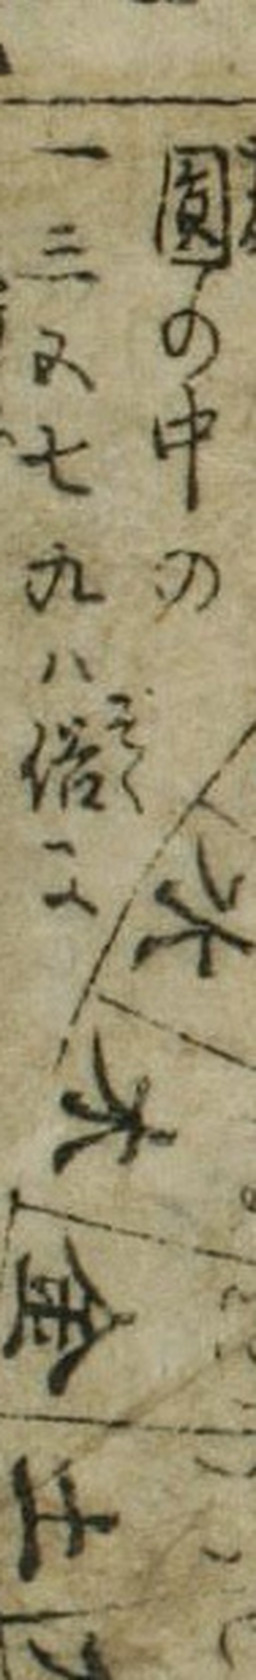一三五七九は俗に
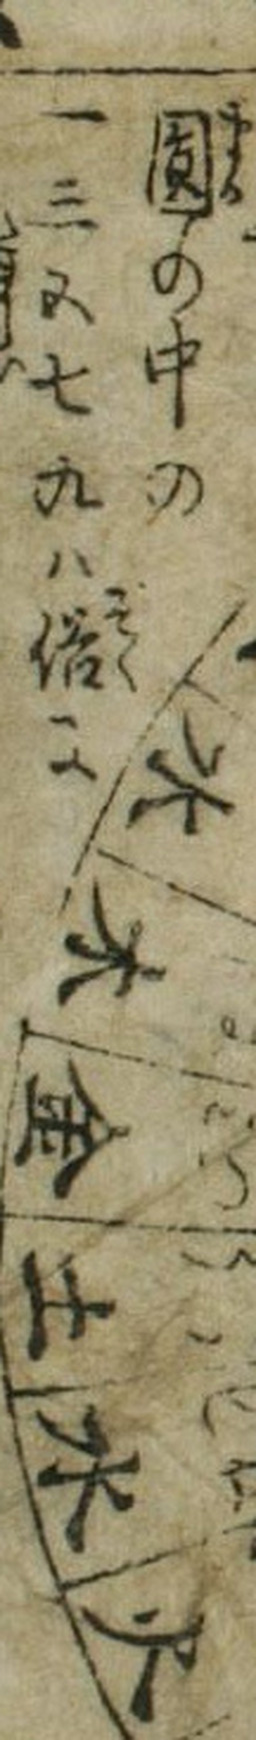一三五七九は俗に
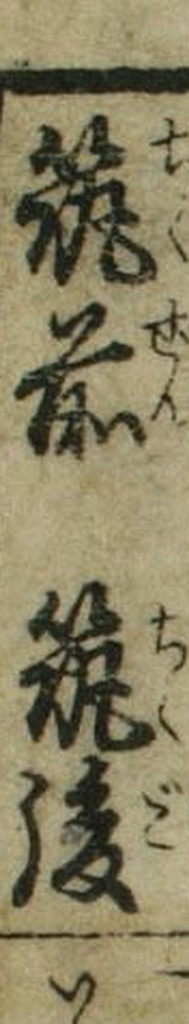筑前筑後
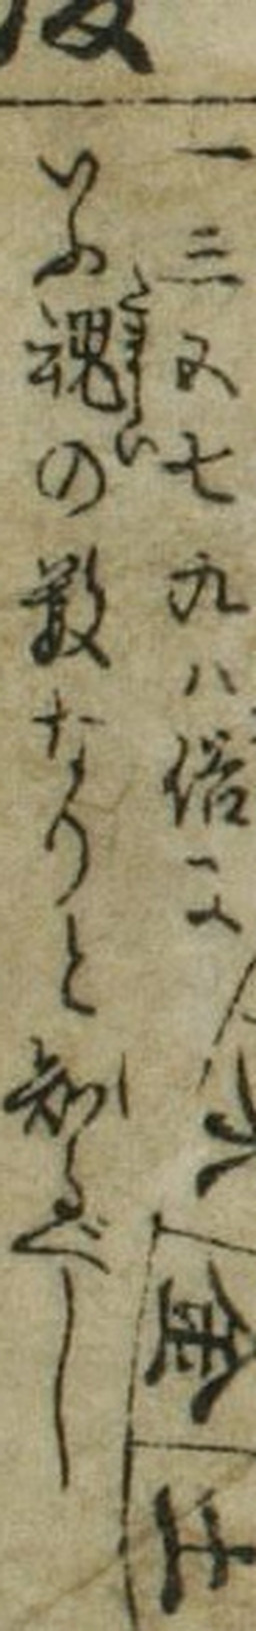いふ魂の数なりと知るべし
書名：百人一首
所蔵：東京学芸大学教育コンテンツアーカイブ
